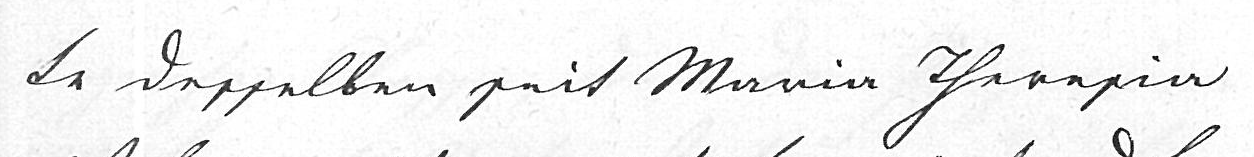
te desselben seit Maria Theresia
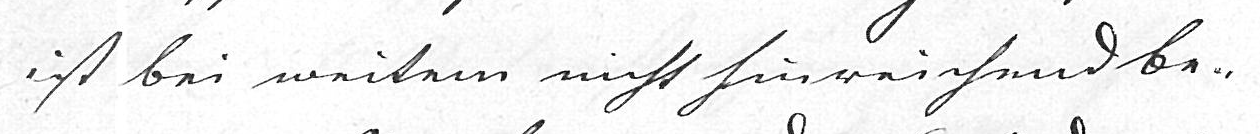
ist bei weitem nicht hinreichend be-
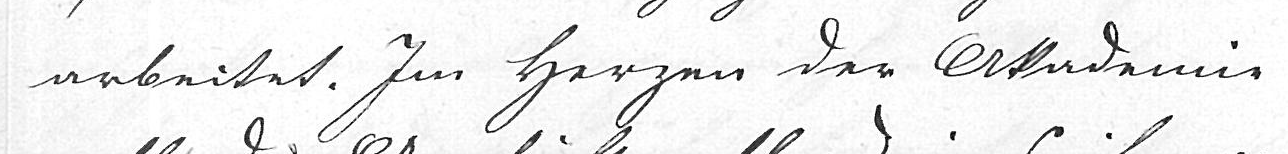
arbeitet. Im Herzen der Akademie
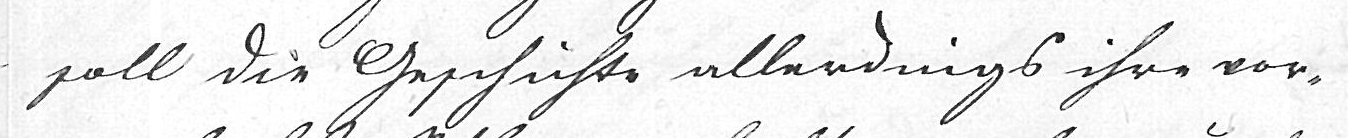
soll die Geschichte allerdings ihre vor-
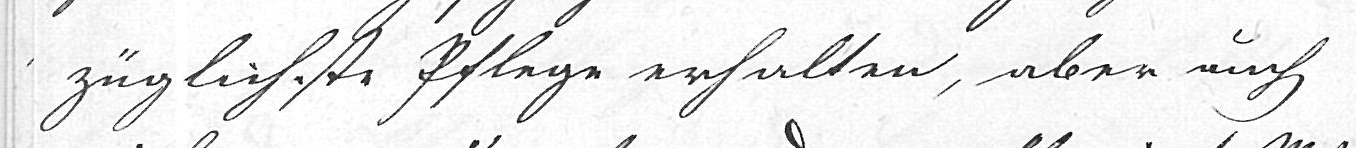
züglichste Pflege erhalten, aber auch
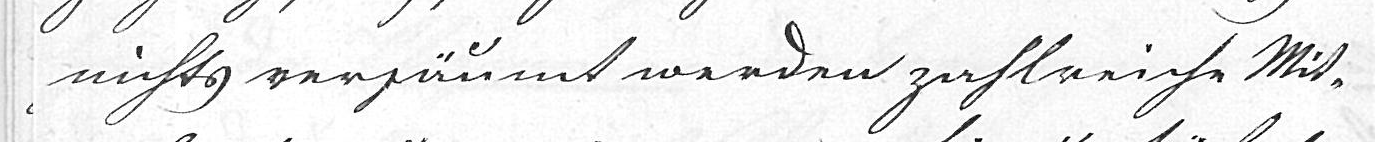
nicht versäumt werden zahlreiche Mit-
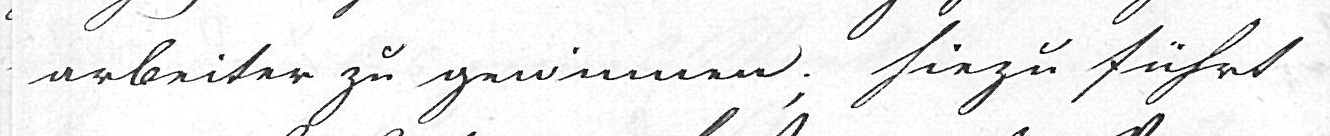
arbeiten zu gewinnen; hiezu führt
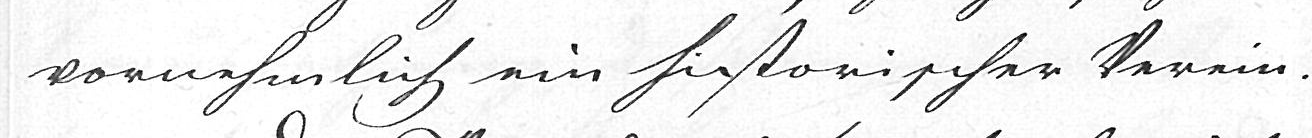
vornehmlich ein historischen Verein.
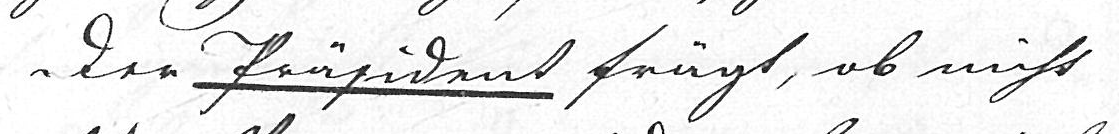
Der Präsident frägt, ob nicht
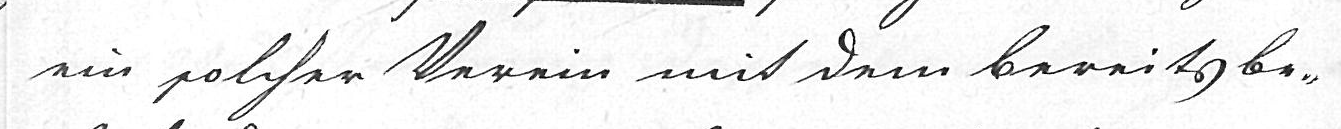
ein solcher Verein mit dem bereits be-
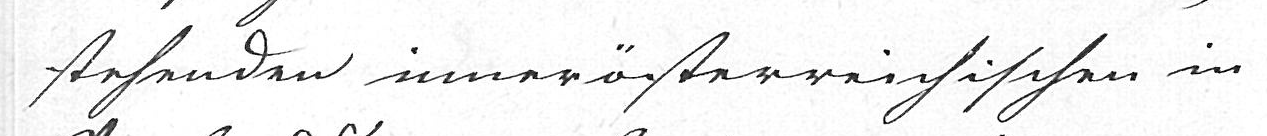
stehenden innerösterreichischen in
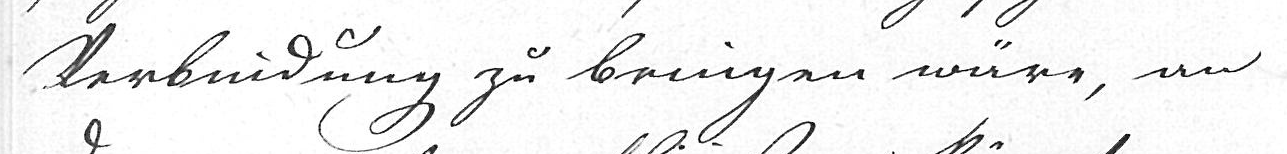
Verbindlung zu bringen wäre, an
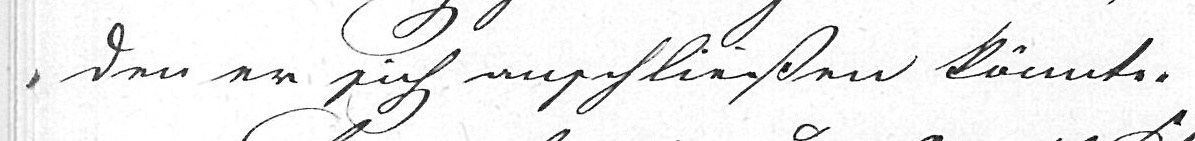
den er sich anschließen könnte.
